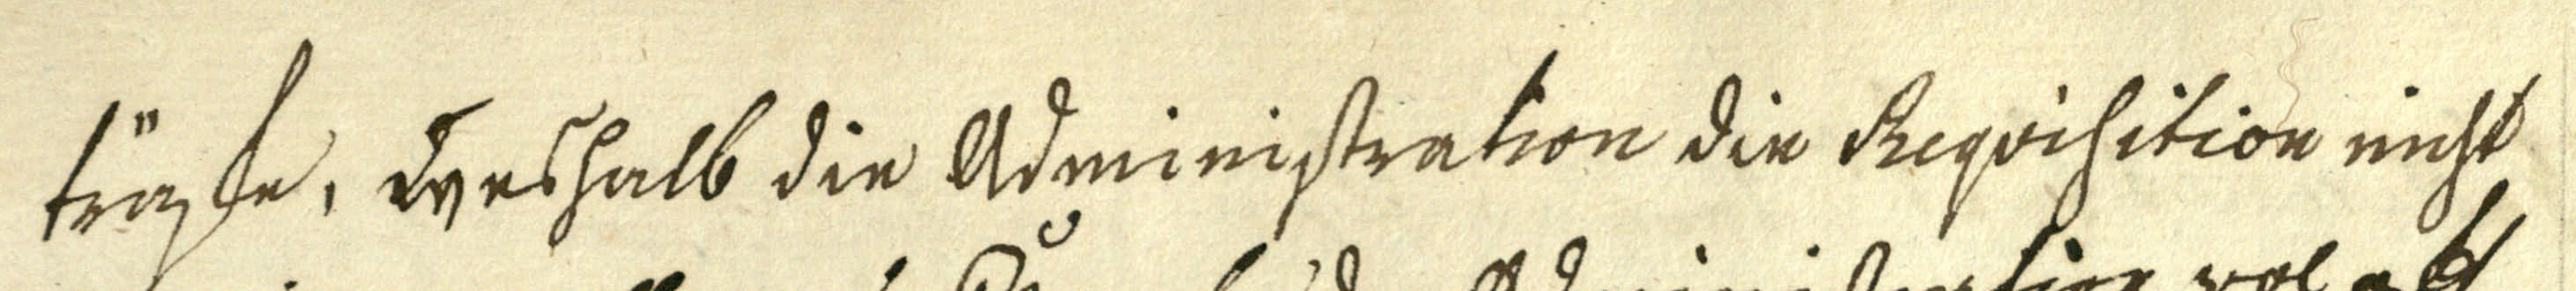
träfe, deshalb die Administration die Requisition nicht
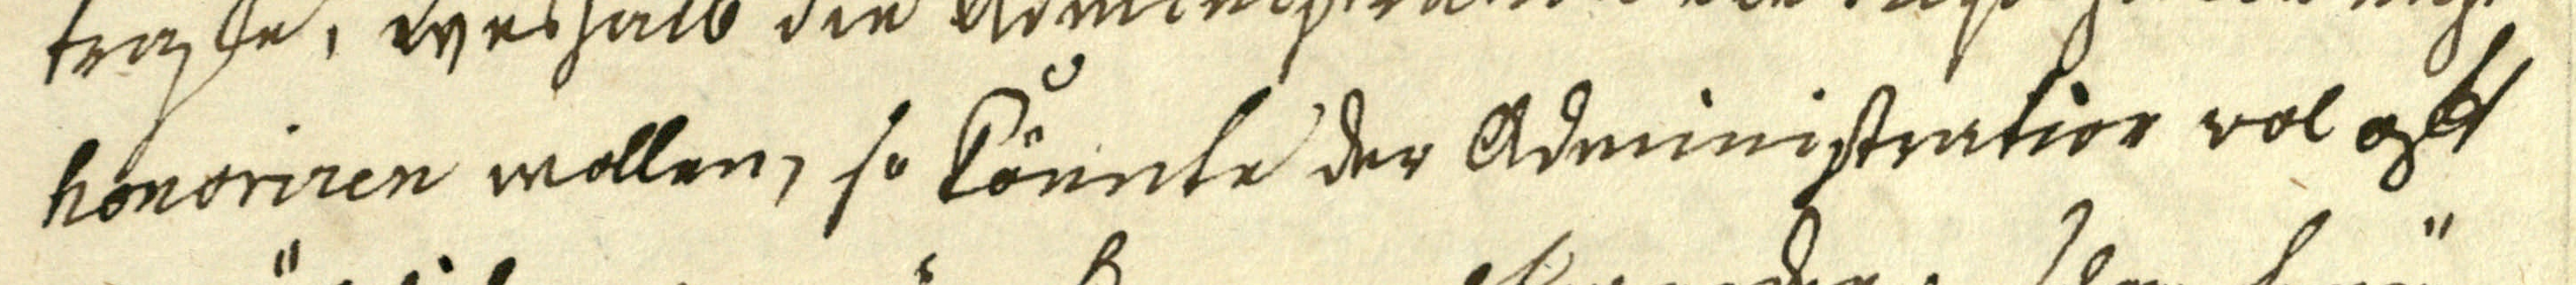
honoriren wollen, so könnte der Administration wol oft
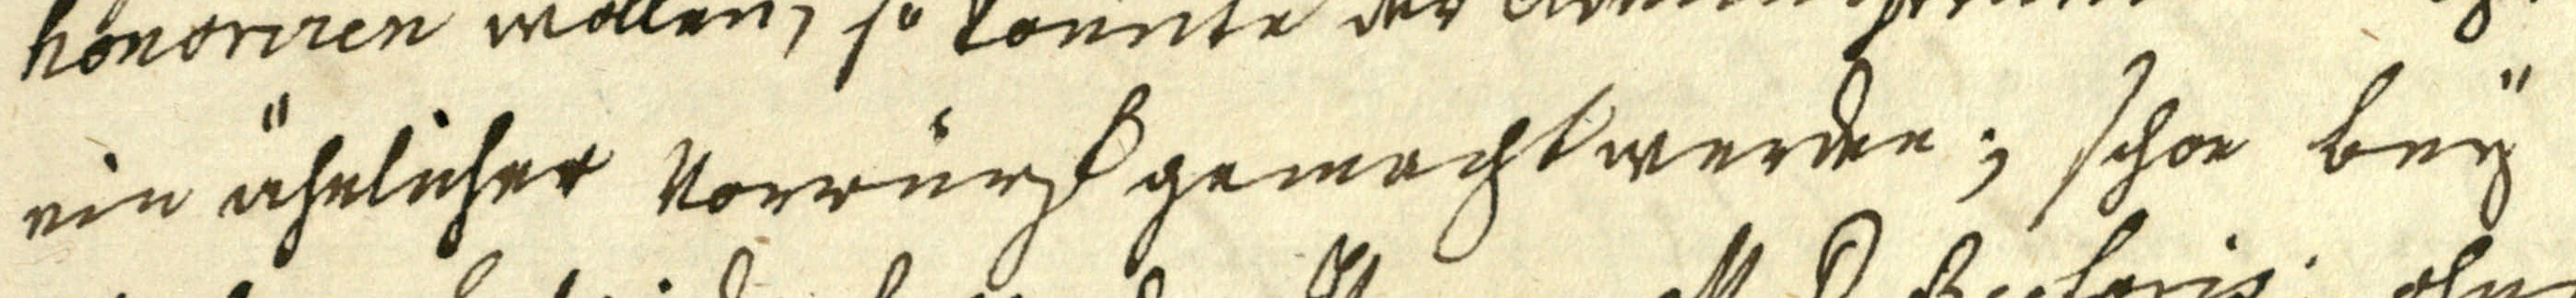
ein ähnlicher Vorwurf gemacht werden; schon beÿ
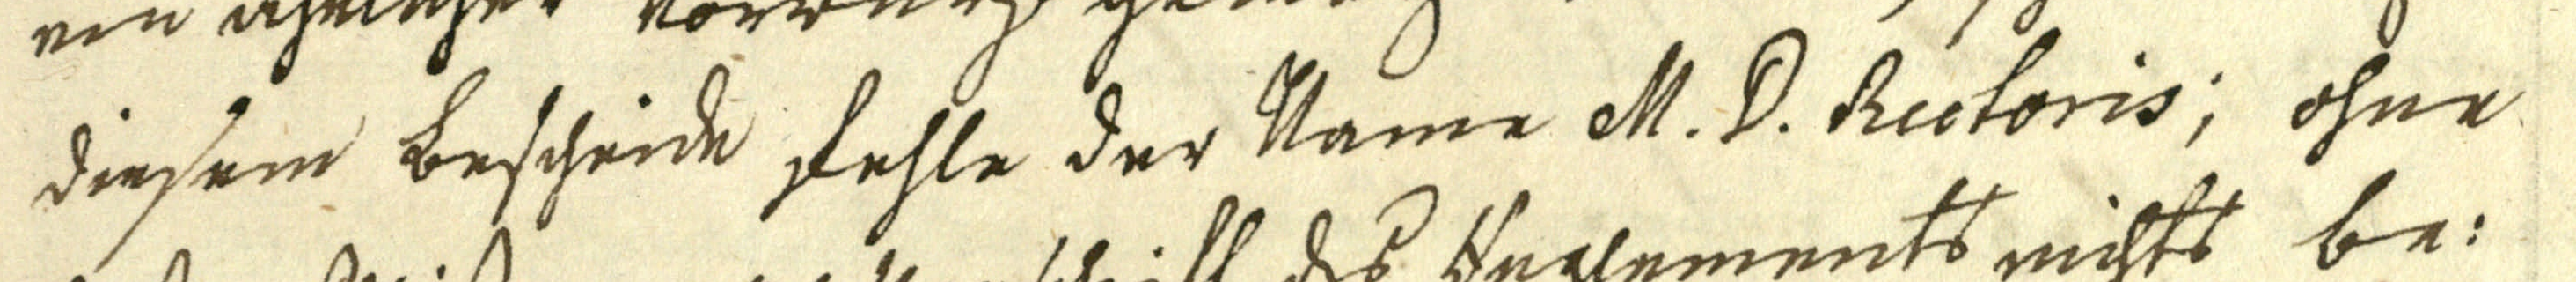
diesem Bescheide fehle der Name M. D. Rectoris; ohne
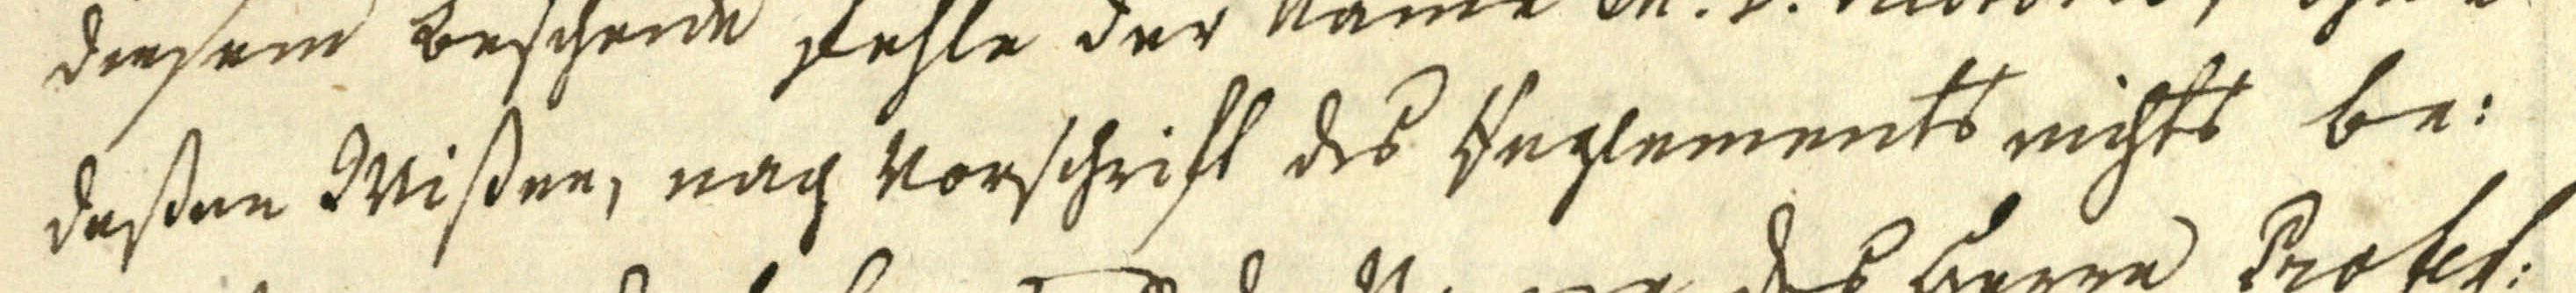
deßen Wißen, nach Vorschrift des Reglements nichts be¬
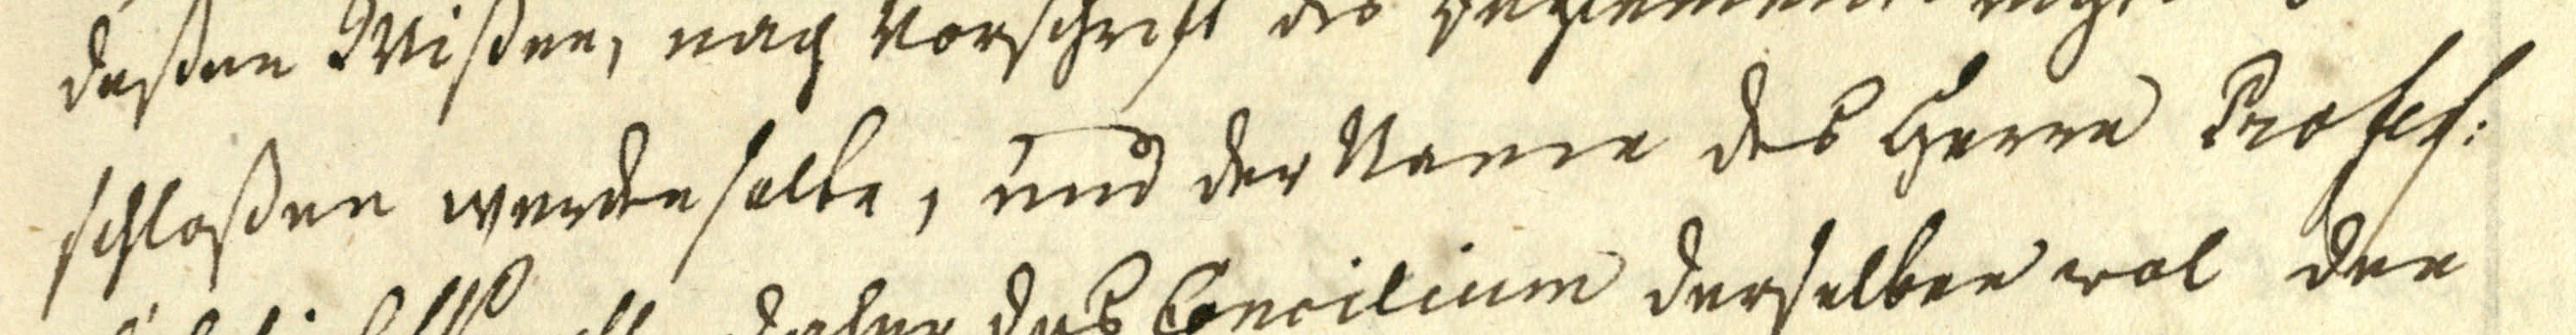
schloßen werden solte, und der Name des Herrn Profes.
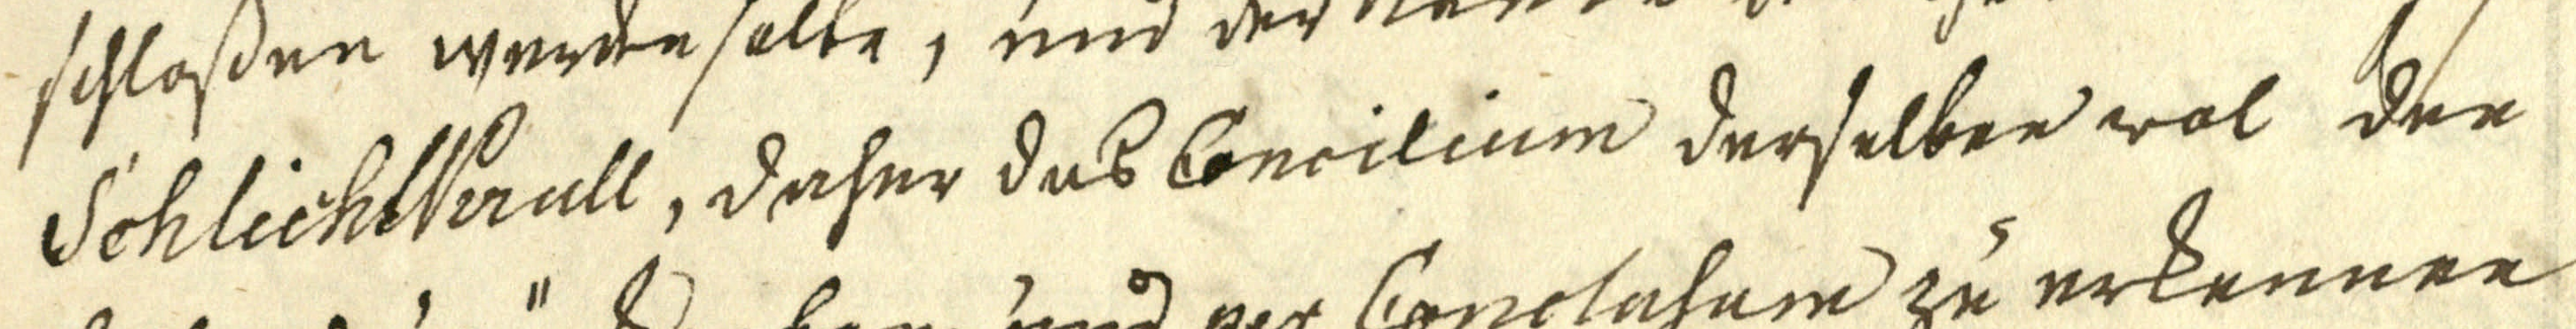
Schlichtkrull, daher das Concilium derselben wol den
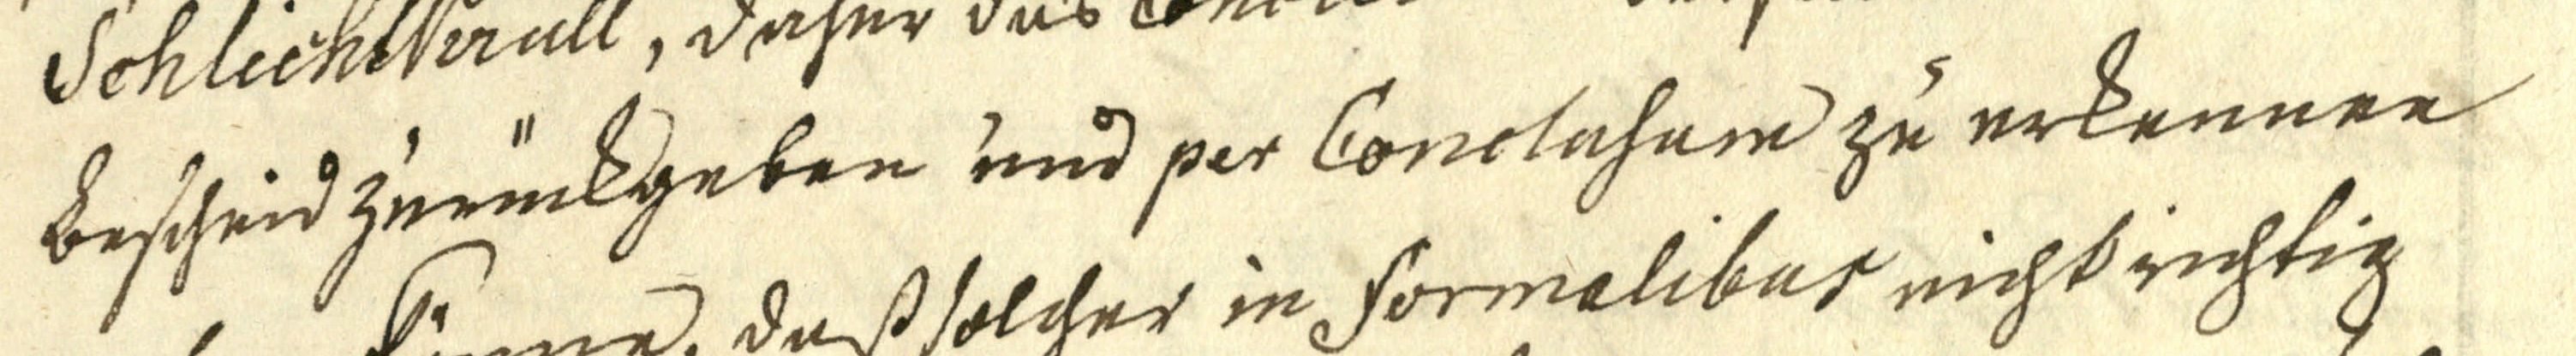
Bescheid zurückgeben und per Conclusum zu erkennen
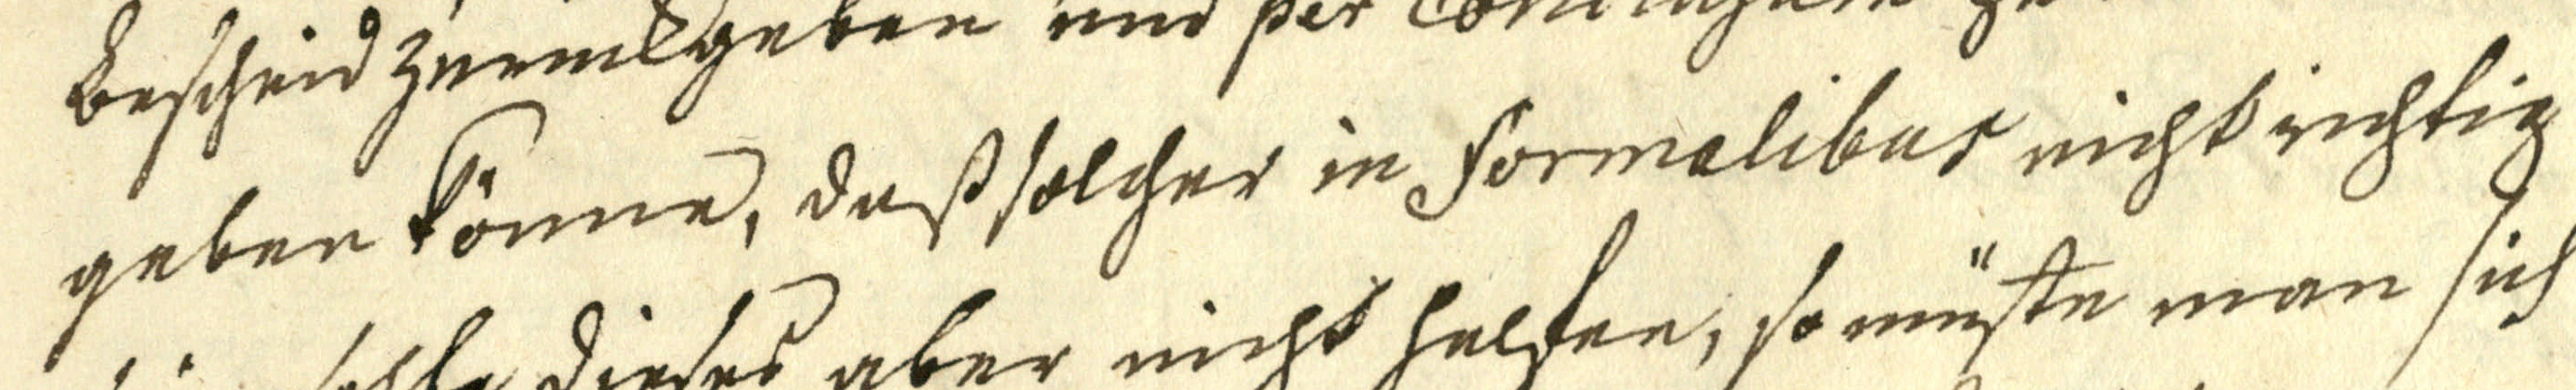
geben könne, daß solcher in formalibus nicht richtig
